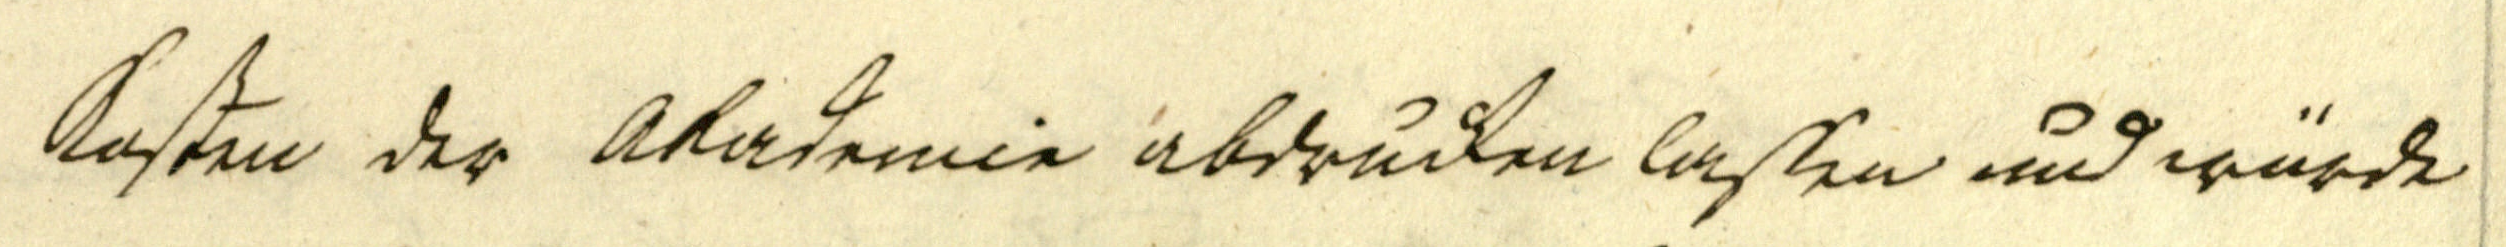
Kosten der Akademie abdrucken lassen und würde
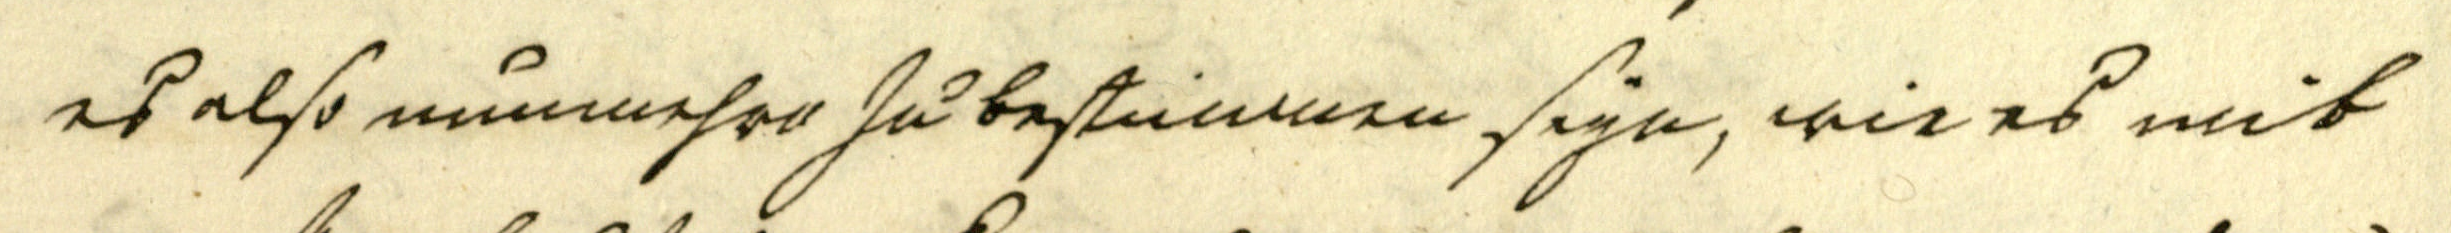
es also nunmehro zu bestimmen seÿn, wie es mit
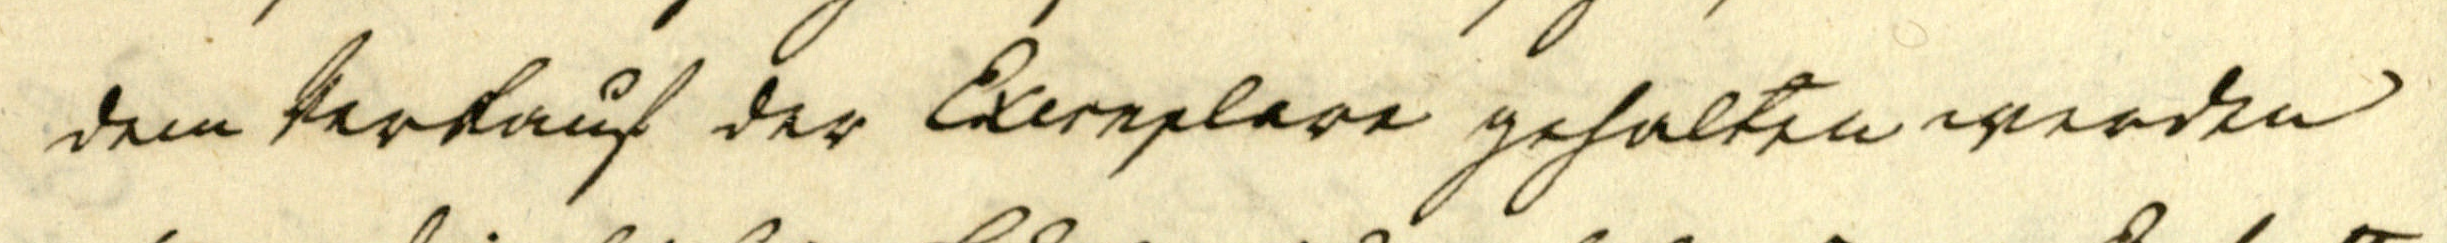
dem Verkauf der Exemplare gehalten werden
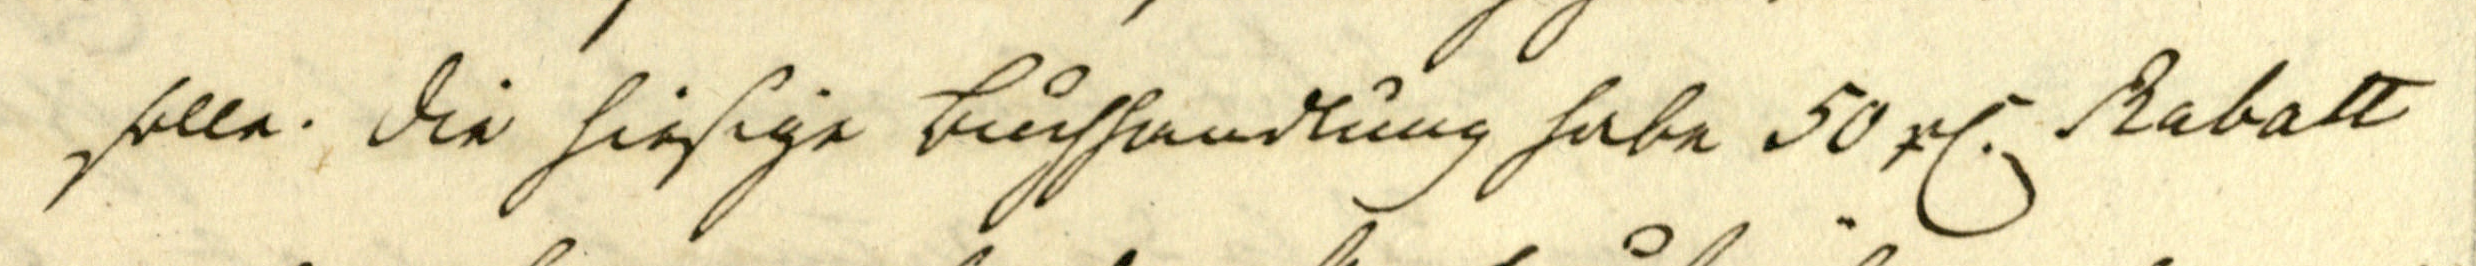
solle. Die hiesige Buchandlung habe 50 rl. Rabatt
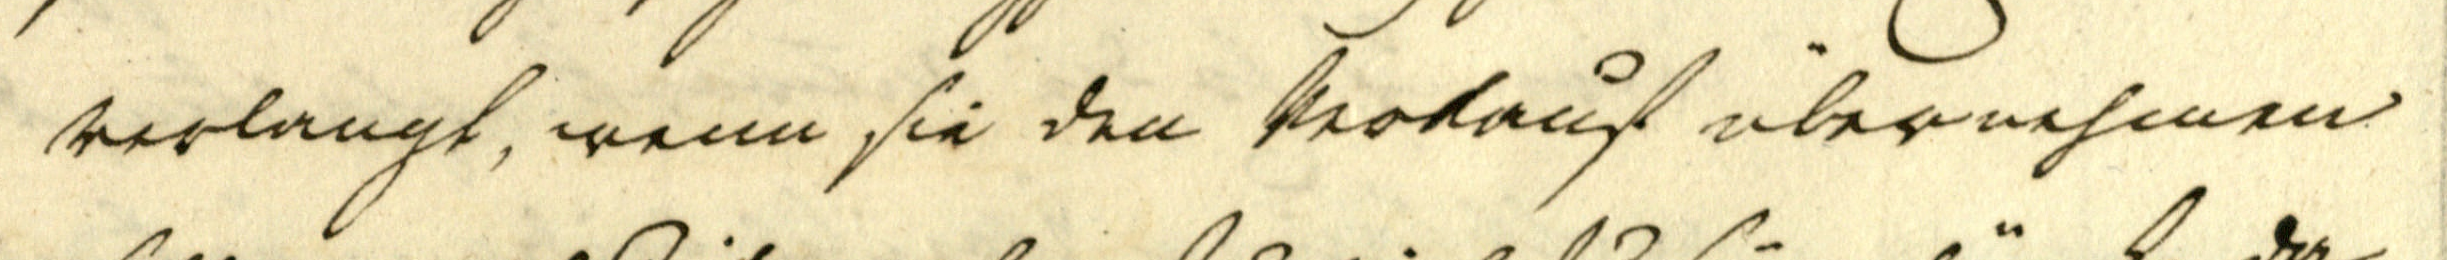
verlangt, wenn sie den Verkauf übernehmen
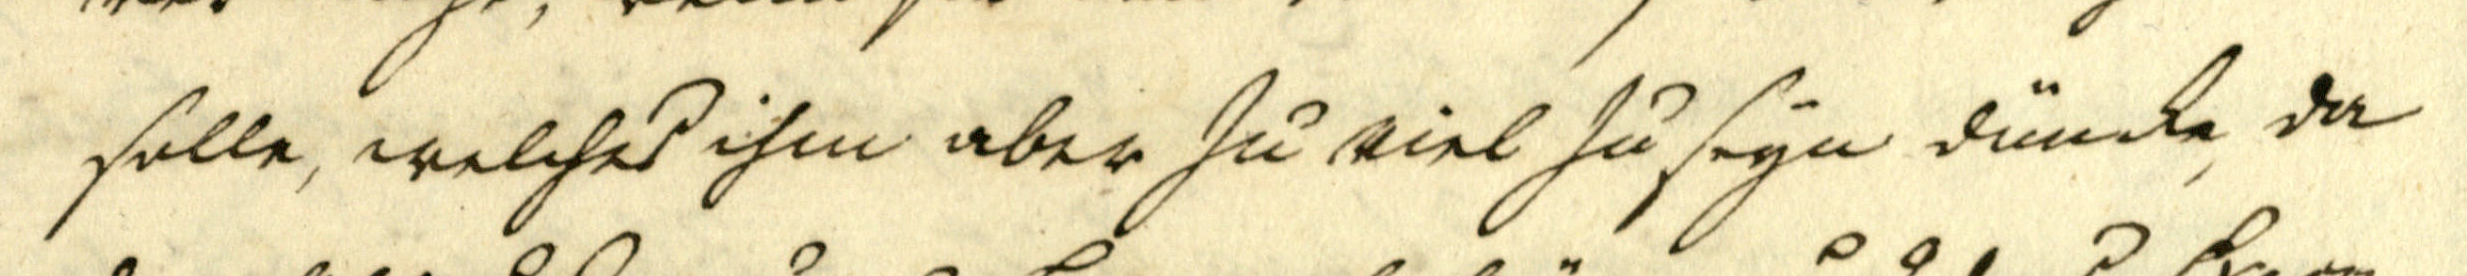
solle, welches ihm aber zu viel zu seÿn düncke, da
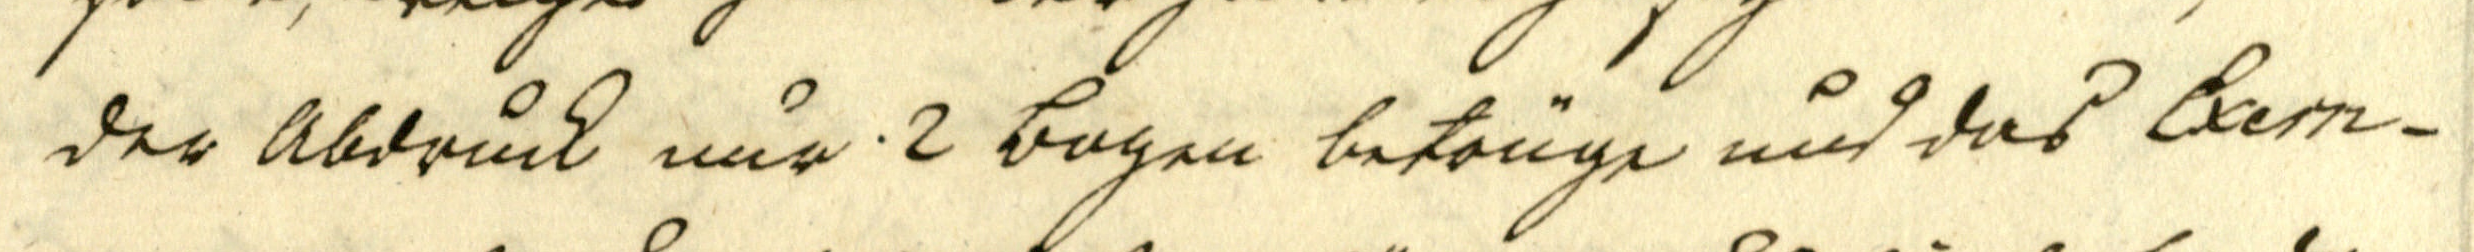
der Abdruck nur 2 Bogen betrüge und das Exem¬
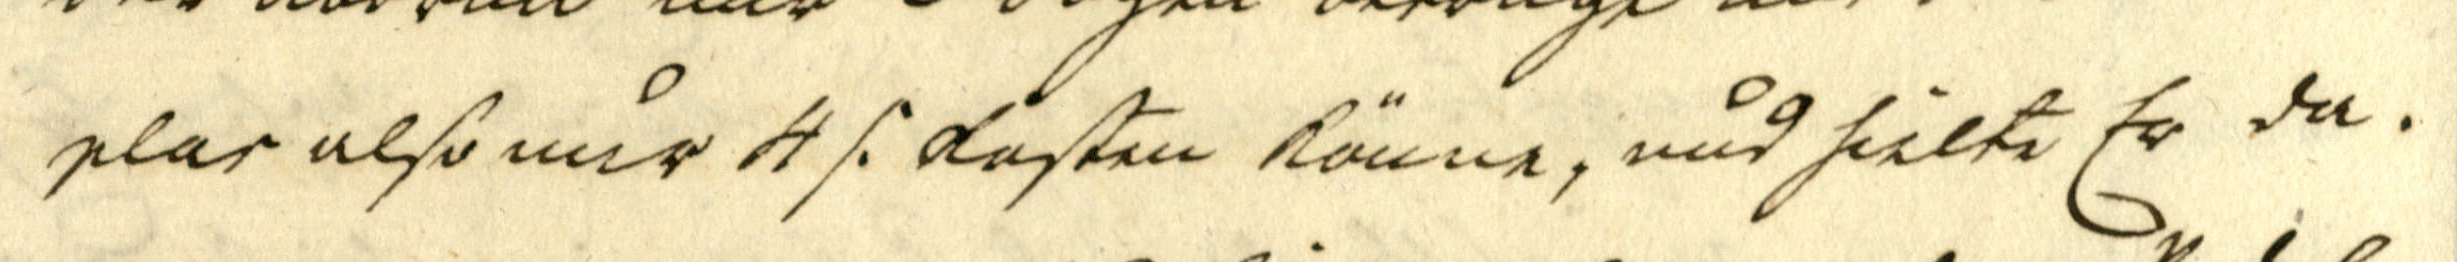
plar also nur 4 s. kosten könne, und hielte Er da¬
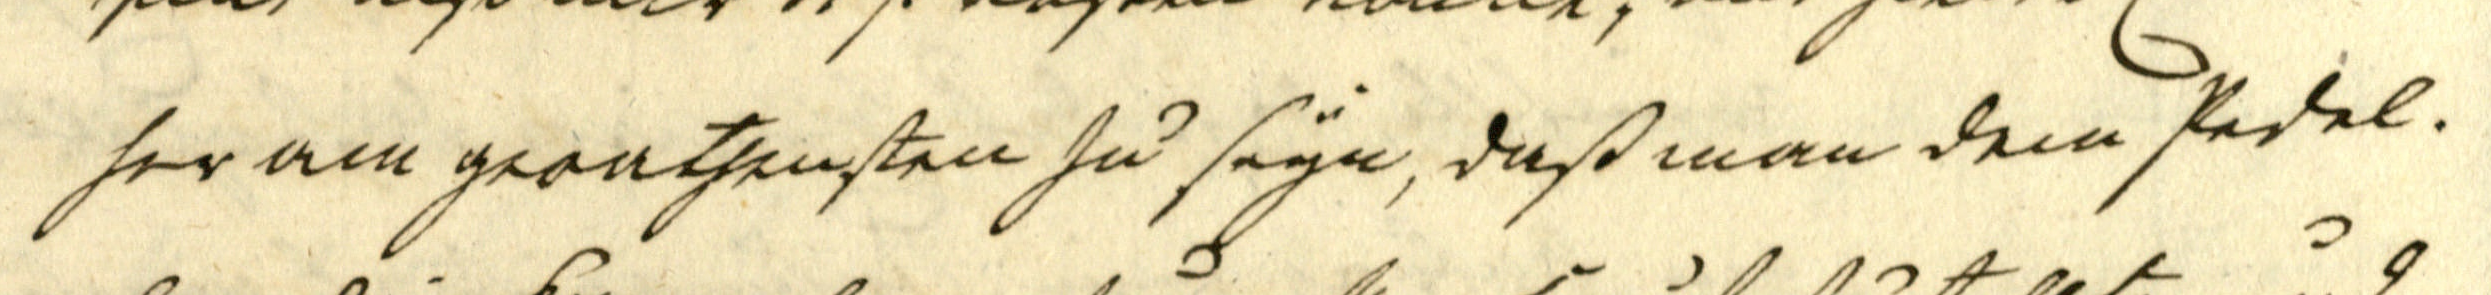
er am gerathensten zu seÿn, daß man dem Pedel¬
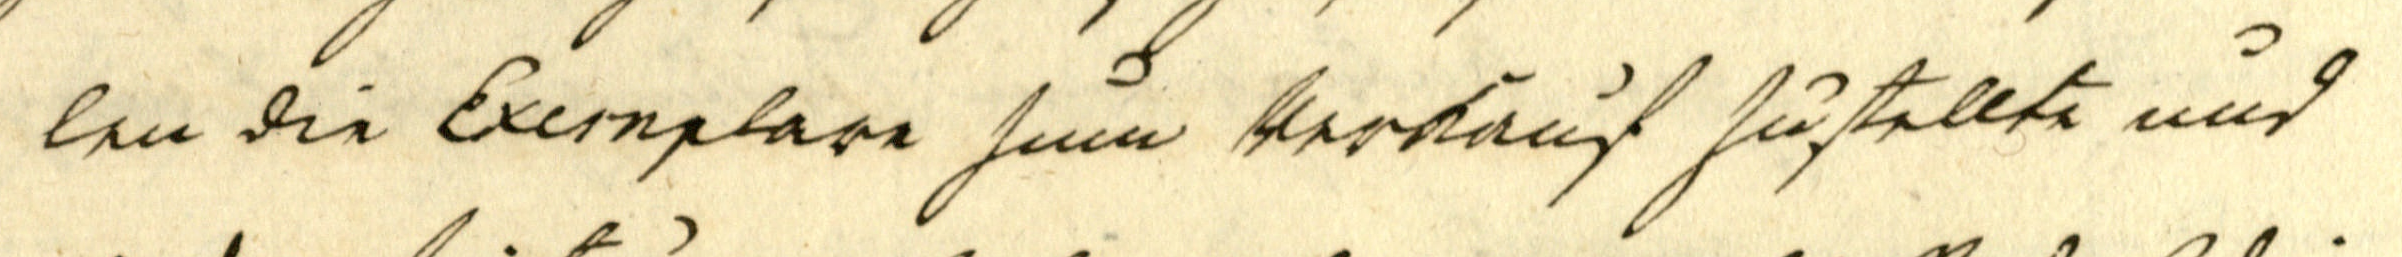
len die Exemplare zum Verkauf zustellte und
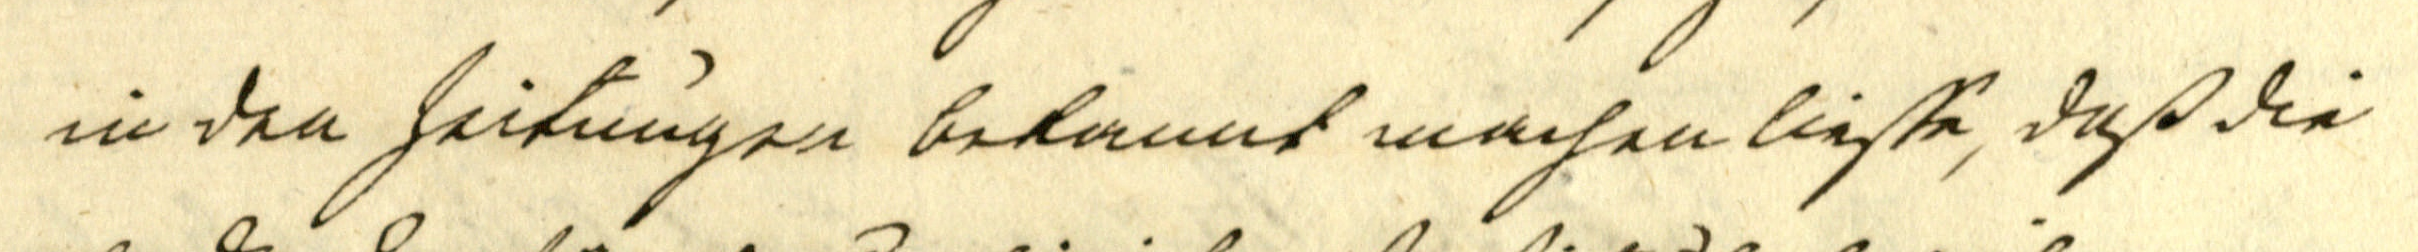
in den Zeitungen bekannt machen liesse, daß die
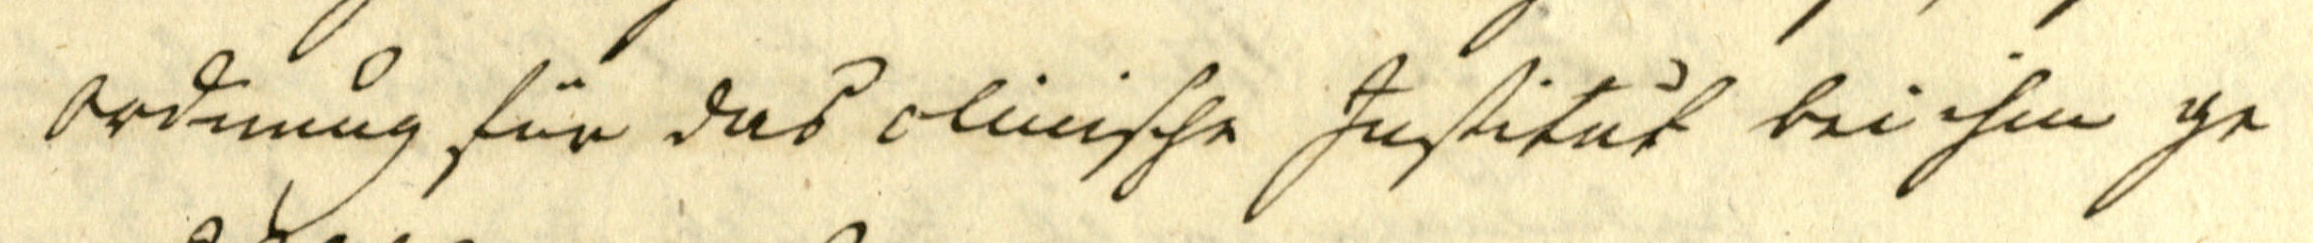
Ordnung für das clinische Institut bei ihm ge¬
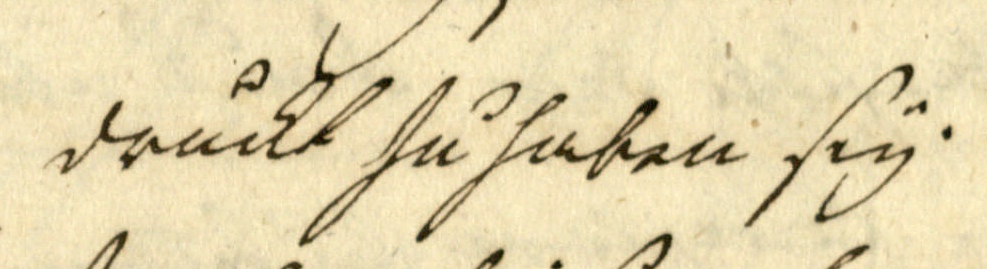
druckt zu haben seÿ.
